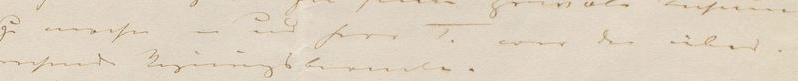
zu machen – und Herr T. war der über-
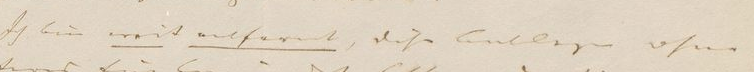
Ich bin weitentfernt, diese Anklage ohne
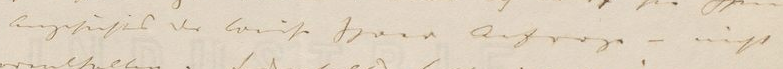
Angesichts der Weise Ihrer Anfrage – nicht
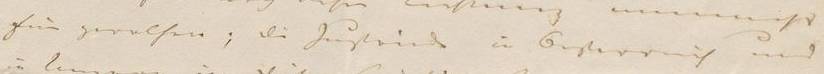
für gerathen; die Zustände in Oesterreich und
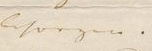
besorgen.
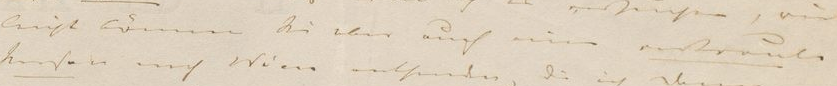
leicht können Sie aber auch eine vertraute
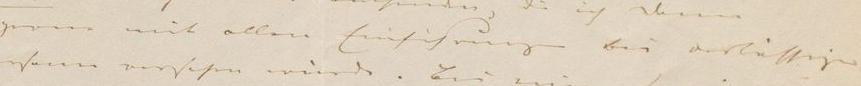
gerne mit allen Einführungen bei verlässigen
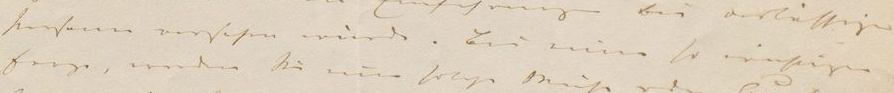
Personen versehen würde. Bei einer so wichtigen
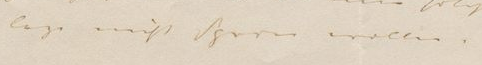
lage nicht sparen wollen.
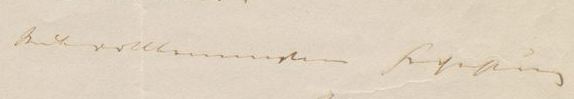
Mit vollkommenster Hochachtung
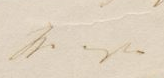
Ihr ergster
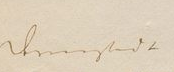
Darmstadt
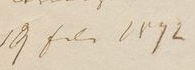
19 Febr 1872
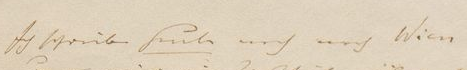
Ich schreibe heute noch nach Wien
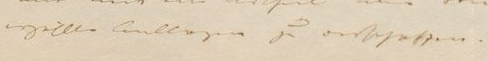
erzählte Anklagen zu verschaffen.
